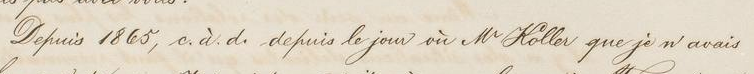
Depuis 1865, c. à. d. depuis le jour où MrKoller que je n'avais
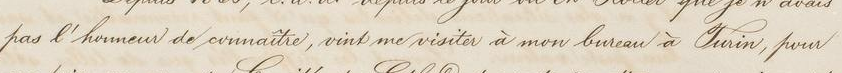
pas l'honneur de connaître, vint me visiter à mon bureau à Turin, pour
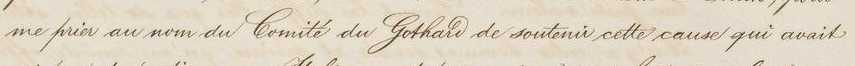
me prier au nom du Comité du Gothard de soutenir cette cause qui avait
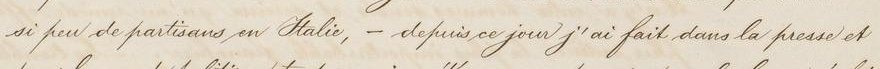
si peu de partisans en Italie, – depuis ce jour j'ai fait dans la presse et
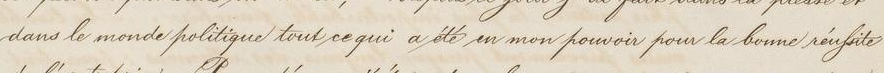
dans le monde politique tout ce qui a été en mon pouvoir pour la bonne réussite
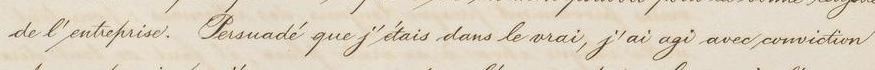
de l'entreprise. Persuadé que j'étais dans le vrai, j'ai agi avec conviction
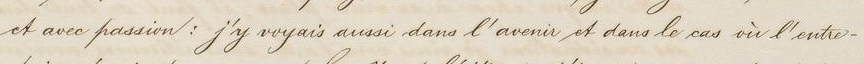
et avec passion: j'y voyais aussi dans l'avenir et dans le cas où l'entre-
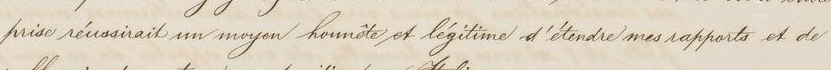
prise réussirait un moyen honnête et légitime d'étendre mes rapports et de
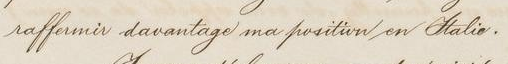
raffermir davantage ma position en Italie.
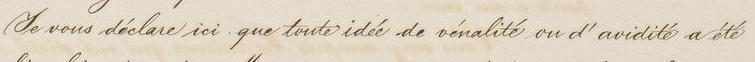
Je vous déclare ici que toute idée de vénalité ou d'avidité a été
